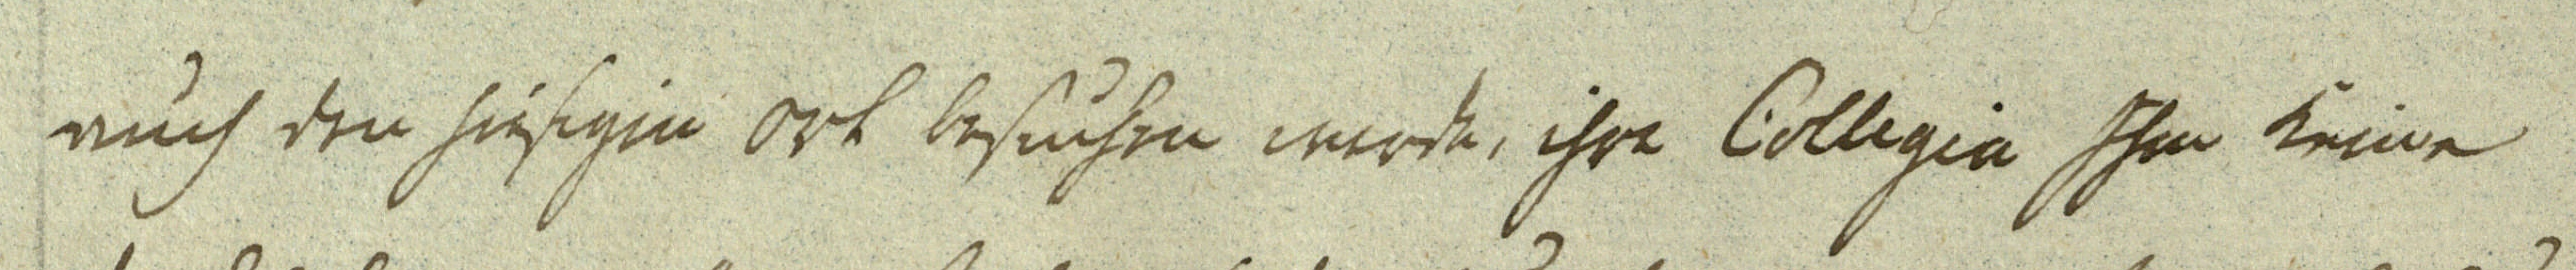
auch den hiesigen Ort besuchen werde, ihre Collegia Ihm keine
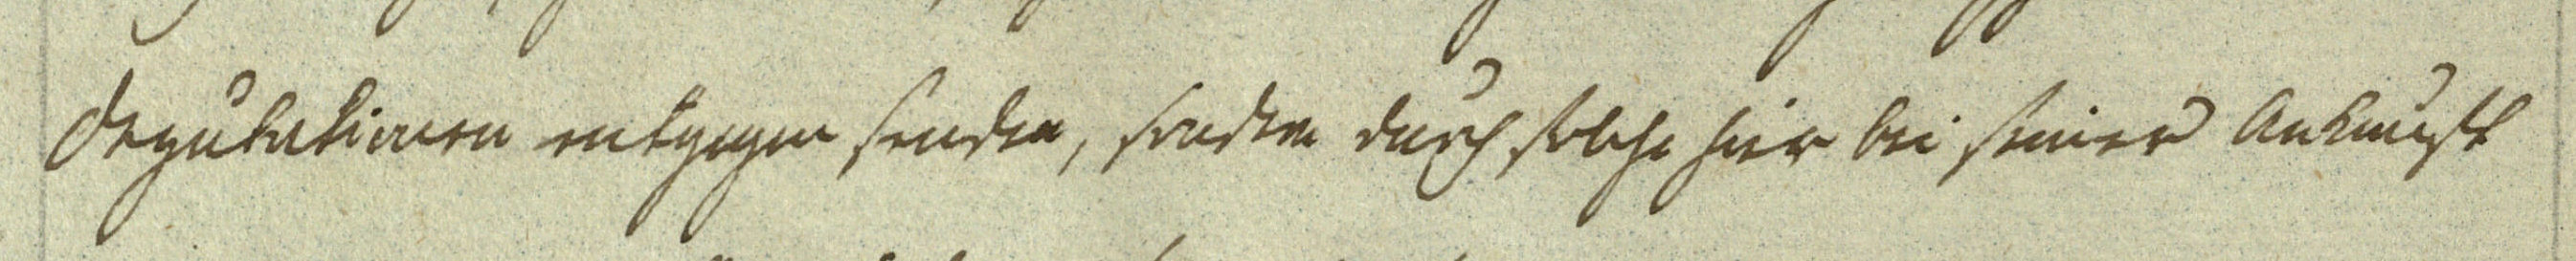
Deputationen entgegen senden, sondern durch solche hier bei seiner Ankunft
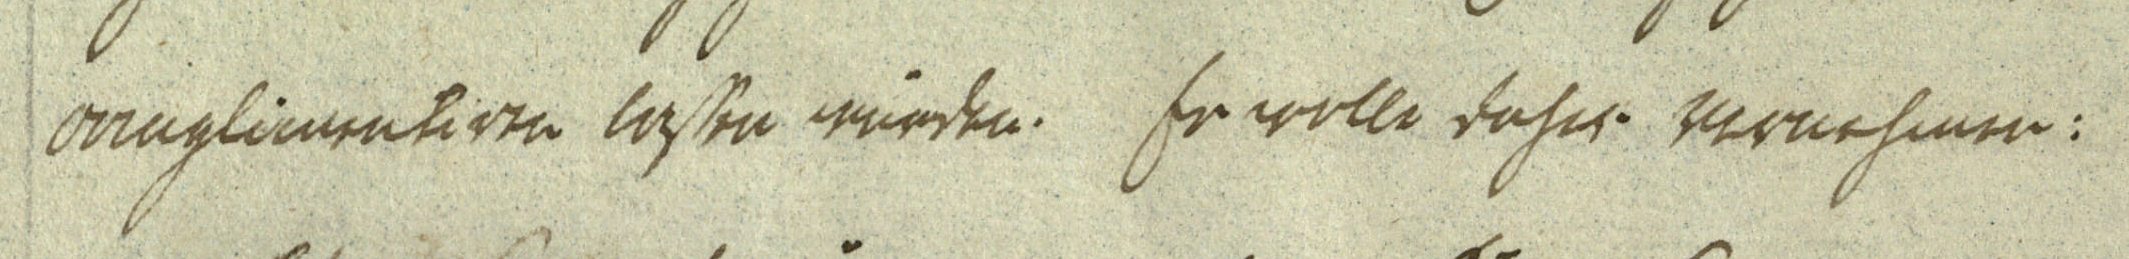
complimentiren lassen würden. Er wolle daher vernehmen:
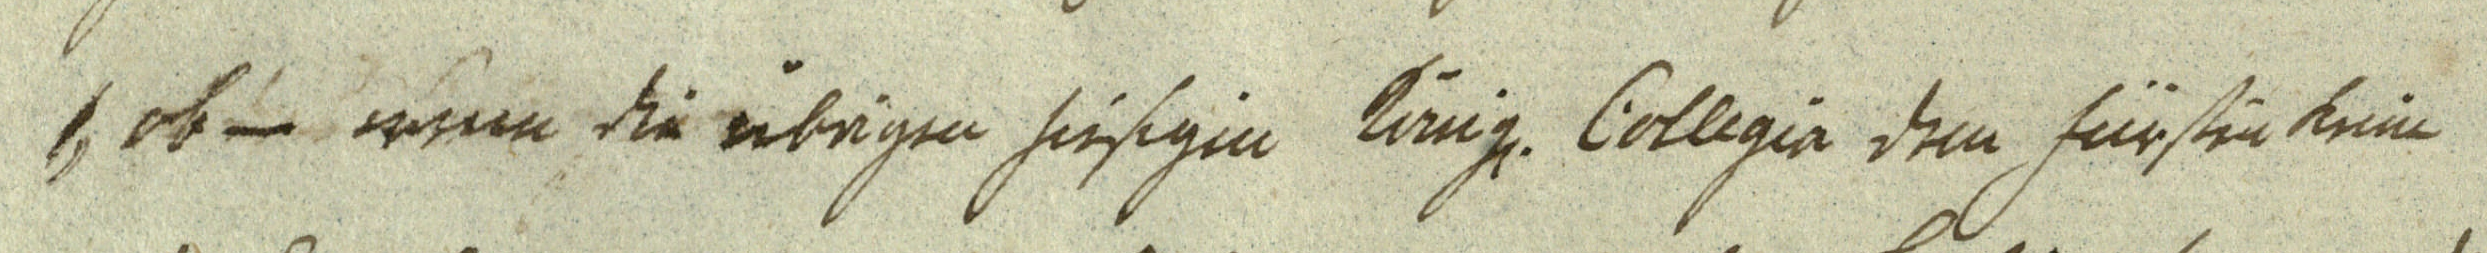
1. ob - wenn die übrigen hiesigen Königl. Collegia dem Fürsten keine
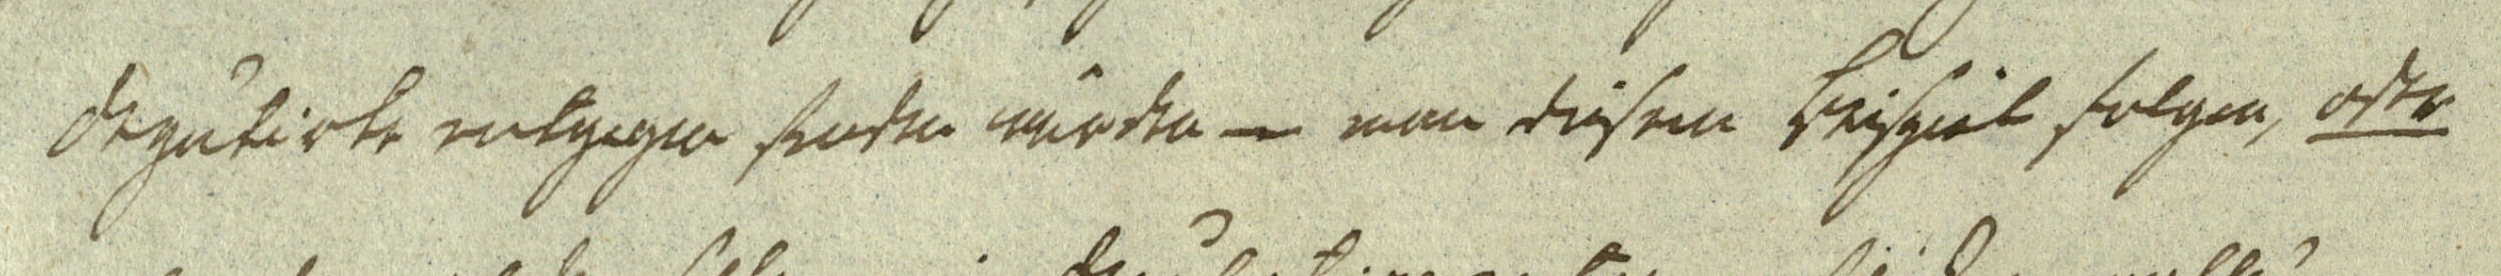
Deputirte entgegen senden würden - man diesem Beispiel folgen, oder
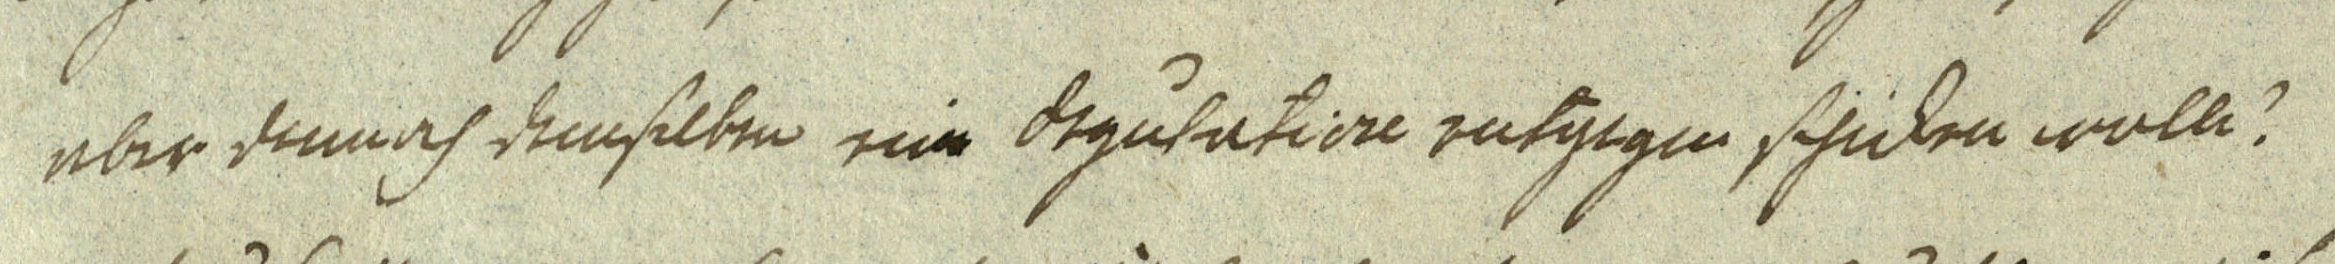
aber dennoch demselben eine Deputation entgegen schicken wolle?
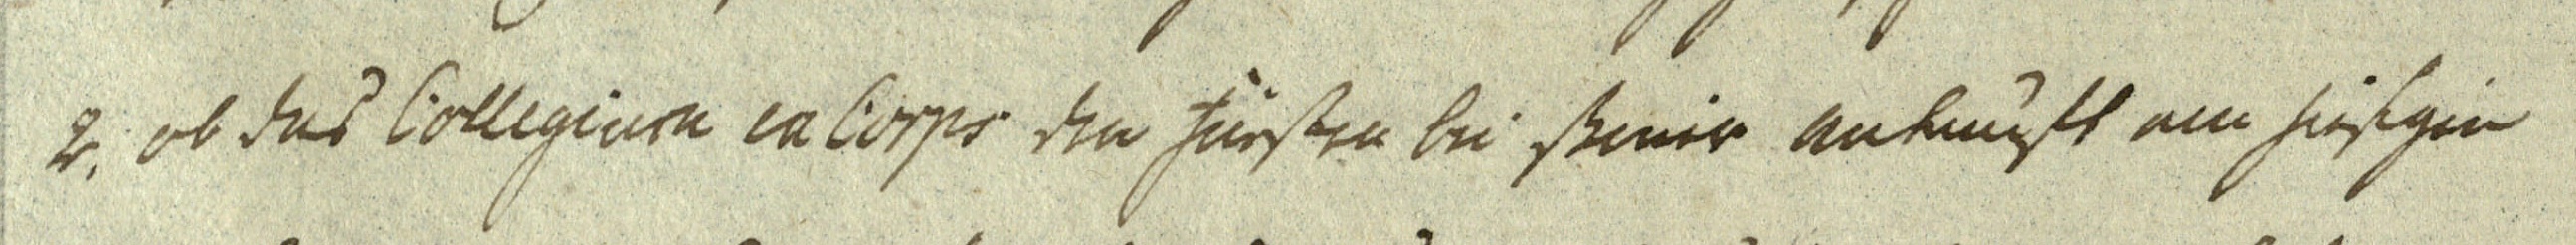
2, ob das Collegium en Corps den Fürsten bei seiner Ankunft am hiesigen
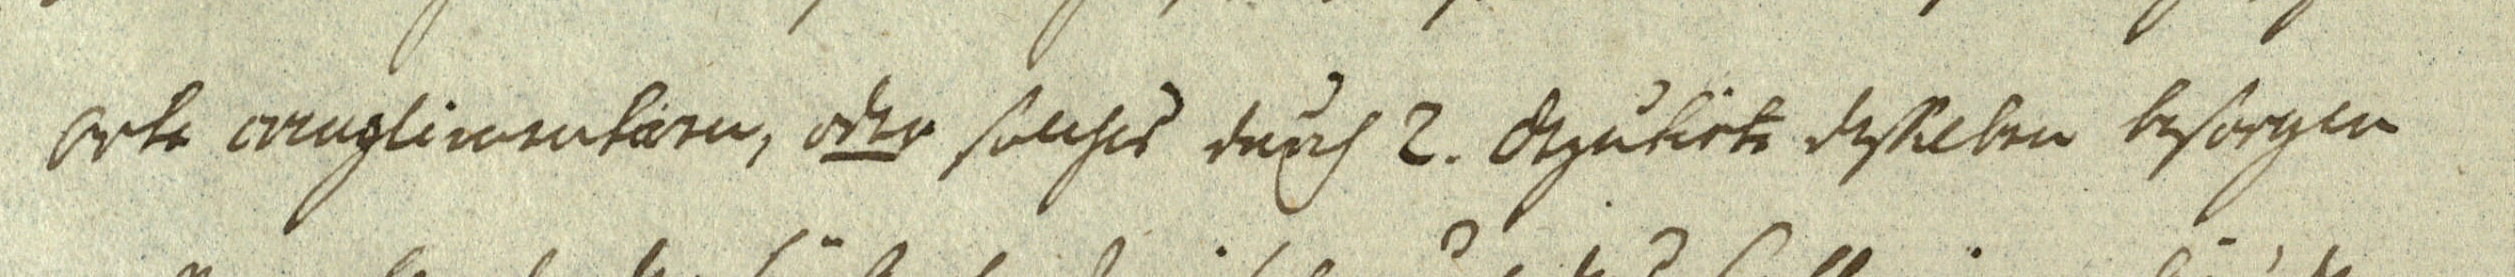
Orte complimentiren, oder solches durch 2. Deputirte desselben besorgen
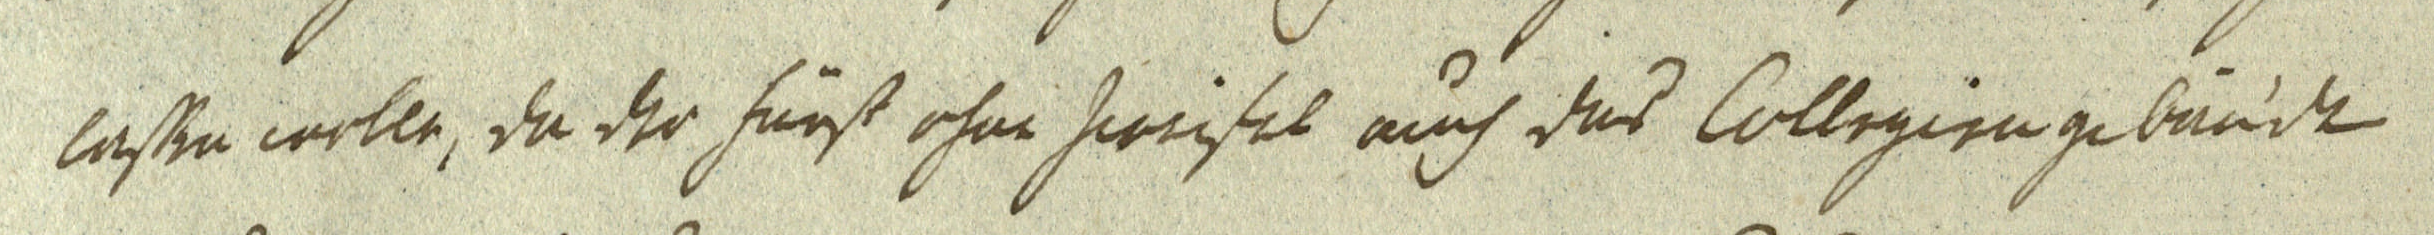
lassen wolle, da der Fürst ohne Zweifel auch das Collegiengebäude
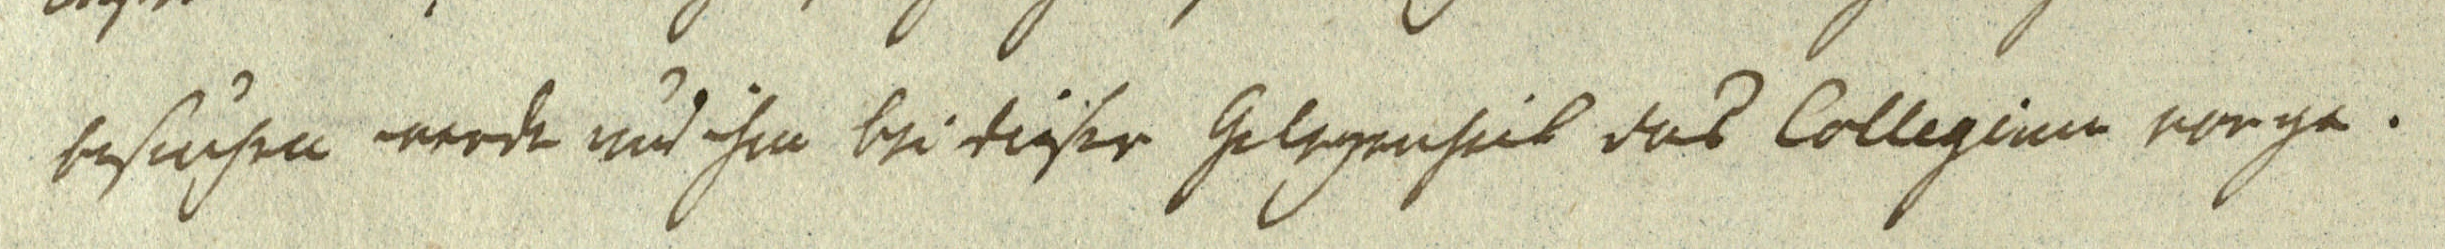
besuchen werde und ihm bei dieser Gelegenheit das Collegium vorge¬
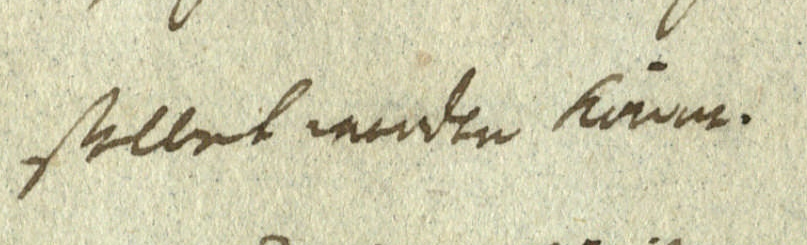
stellet werden könne.
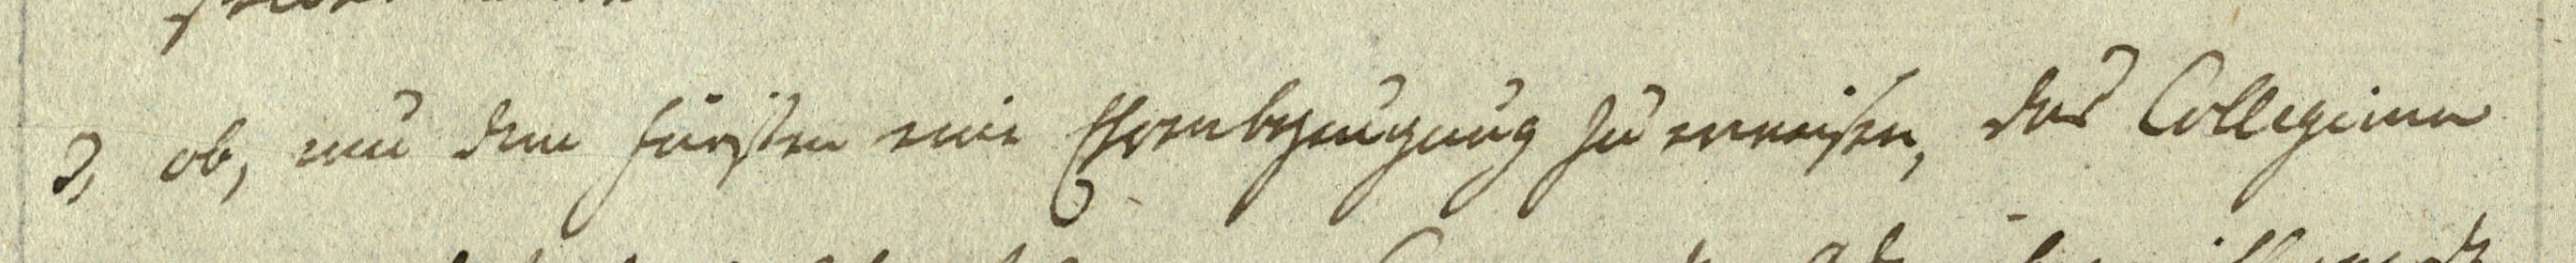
3. ob, um dem Fürsten eine Ehrenbezeugung zu erweisen, das Collegium
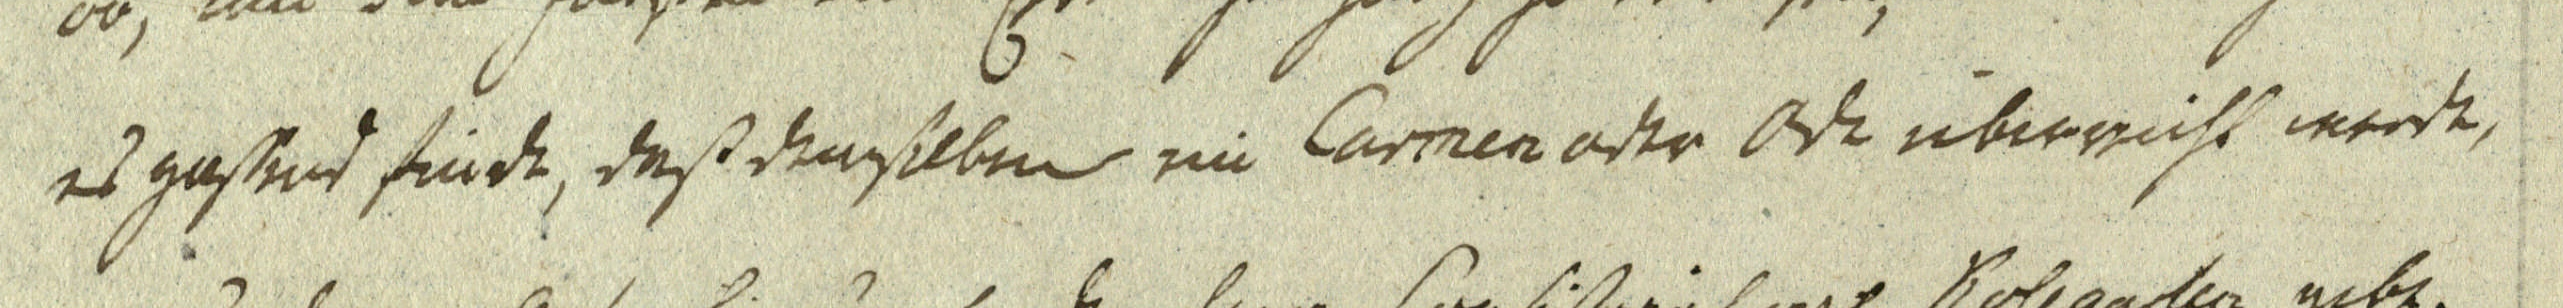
es passend finde, daß demselben ein Carmen oder Ode überreicht werde,
